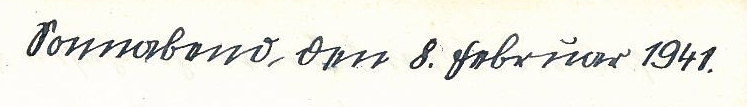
Sonnabend, den 8. Februar 1941.
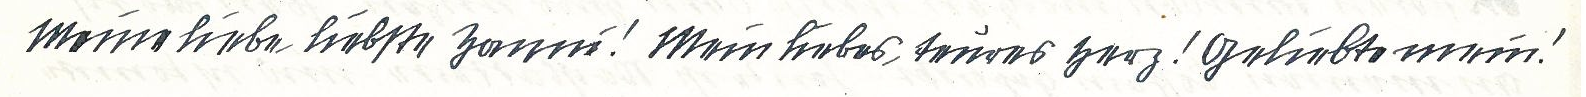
Meine liebe, liebste! Mein liebes, teures Herz! Geliebte mein!
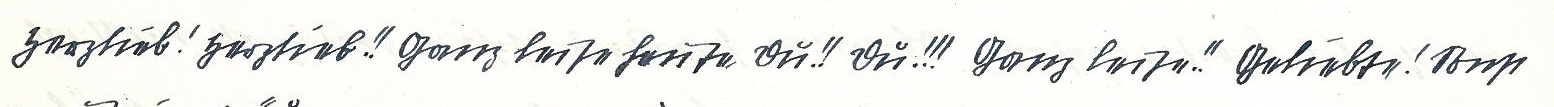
Herzlieb! Herzlieb! Ganz leise heute Du!! Du!!! Ganz leise!! Geliebte! Sonst
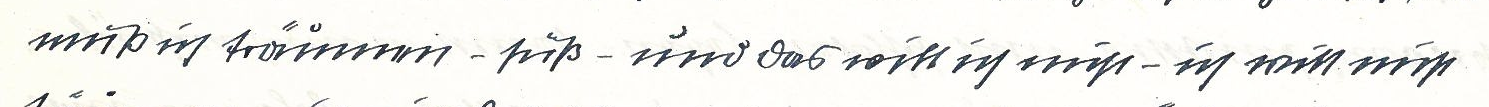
muß ich träumen – süß – und das will ich nicht – ich will nicht
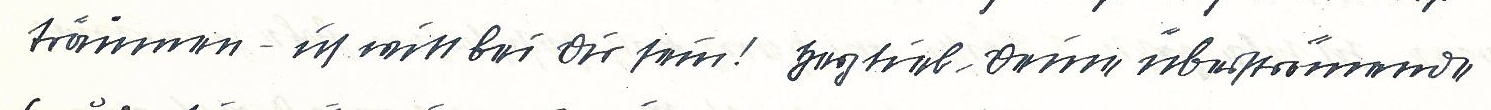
träumen – ich will bei Dir sein! Herzlieb, Deine überströmende
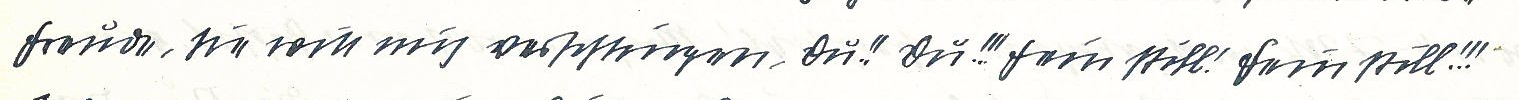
Freude, sie will mich verschlingen, Du!! Du!!! Fein still!!!
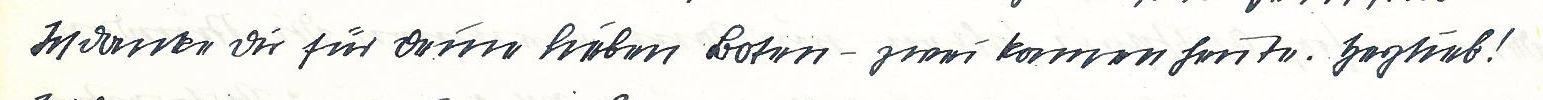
Ich danke Dir für Deine lieben Boten – zwei kamen heute. Herzlieb!
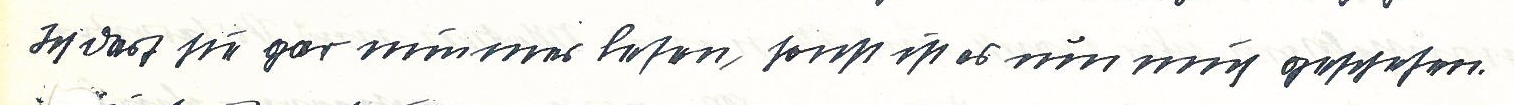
Ich darf sie gar nimmer lesen, sonst ist es um mich geschehen.
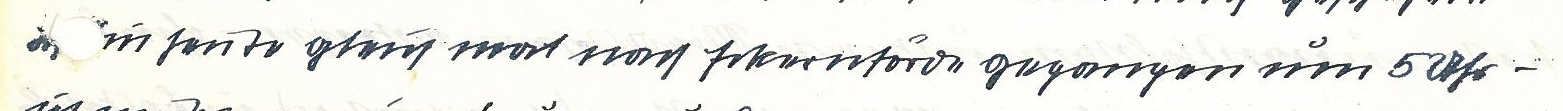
Ich bin heute gleich mal nach Eckernförde gegangen um 5 Uhr –
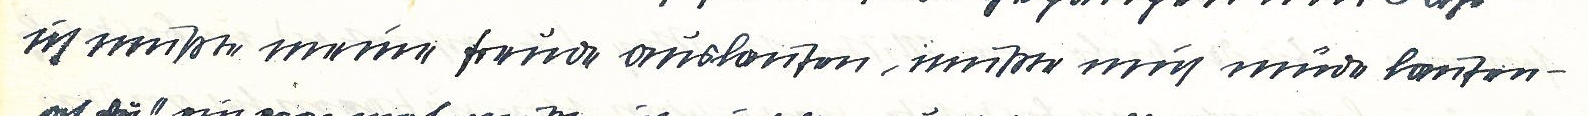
ich mußte meine Freude auslaufen, mußte mich müde laufen –
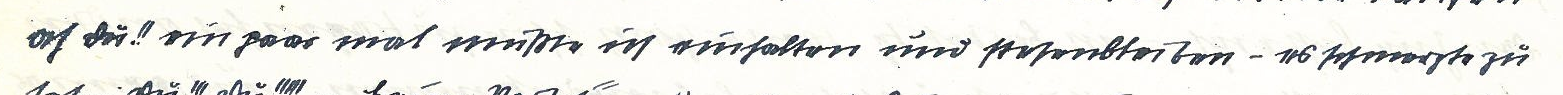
ach Du!! ein paar mal mußte ich einhalten und stehenbleiben – es schmerzte zu
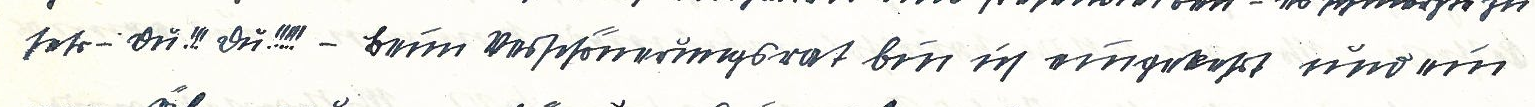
sehr – Du!!! Du!!!!! – Beim Verschönerungsrat bin ich eingekehrt und ein
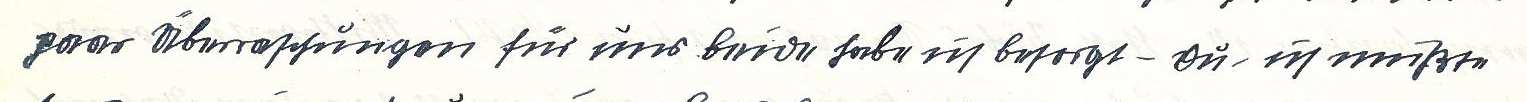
paar Überraschungen für uns beide habe ich besorgt – Du – ich mußte
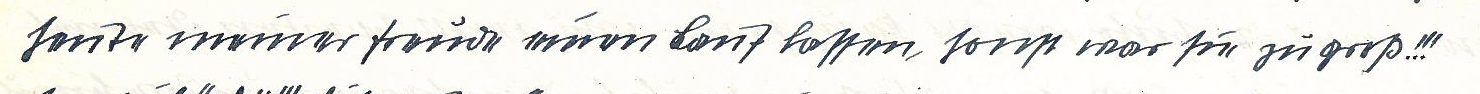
heute meiner Freude einen Lauf lassen, sonst war sie zu groß!!!
